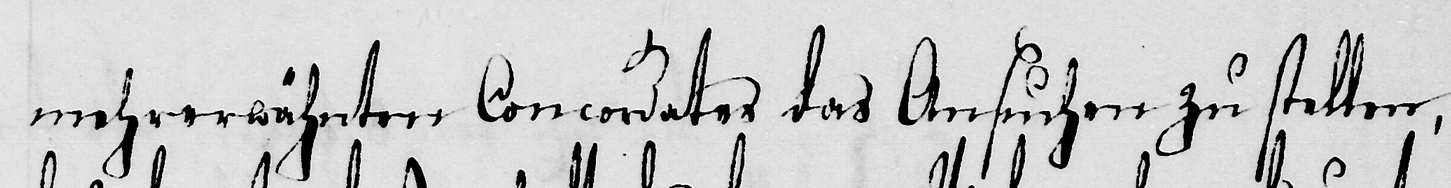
mehrerwähnten Concordates das Ansuchen zu stellen,
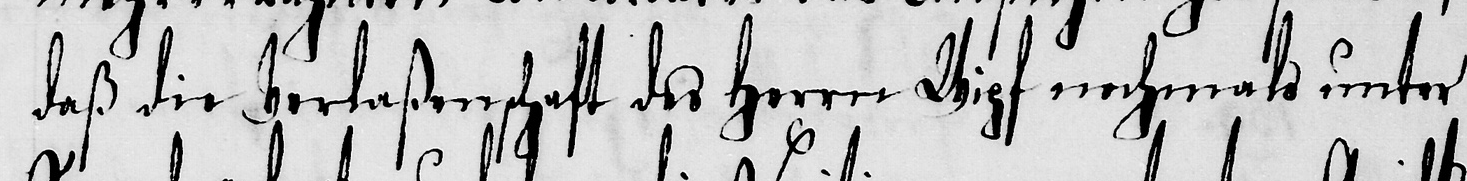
daß die Verlaßenschaft des Herrn Wipf nochmals unter
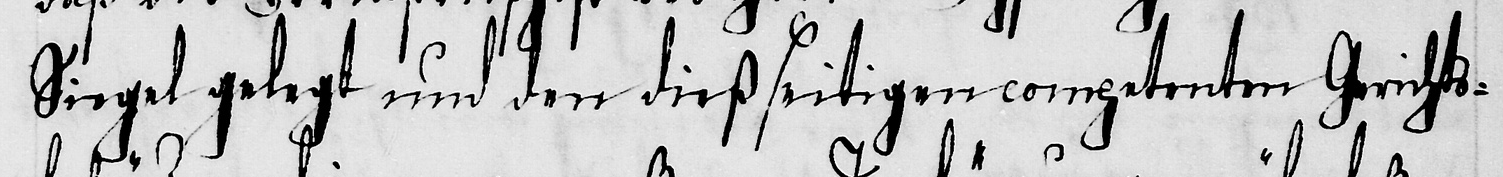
Siegel gelegt und den dießseitigen competenten Gerichts¬
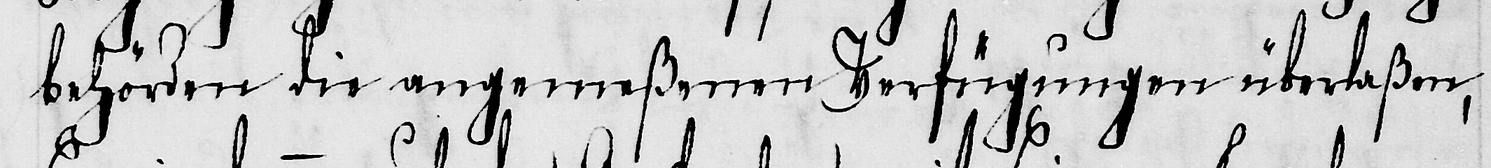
behörden die angemeßenen Verfügungen überlaßen,
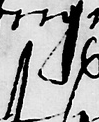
d. M.
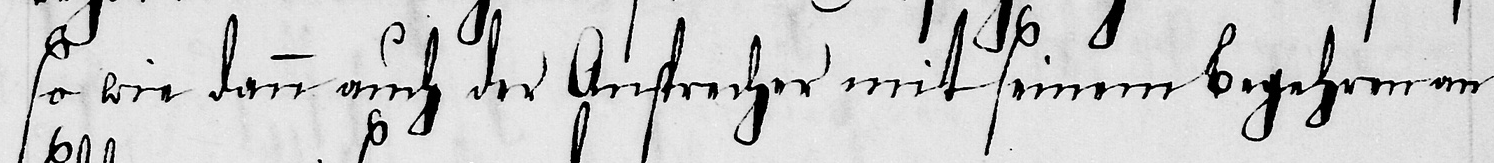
so wie dann auch der Ansprecher mit seinem Begehren an
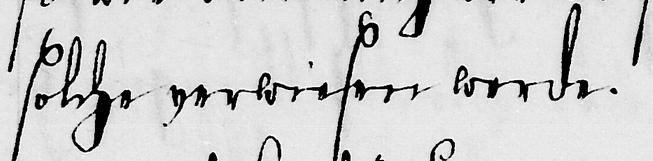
solche verwiesen werden.
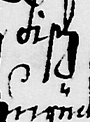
d. 15.
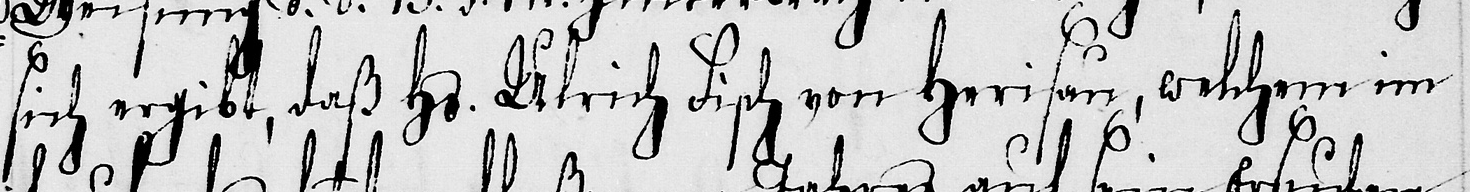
sich ergibt, daß Hs. Ulrich Fisch von Herisau, welchem im
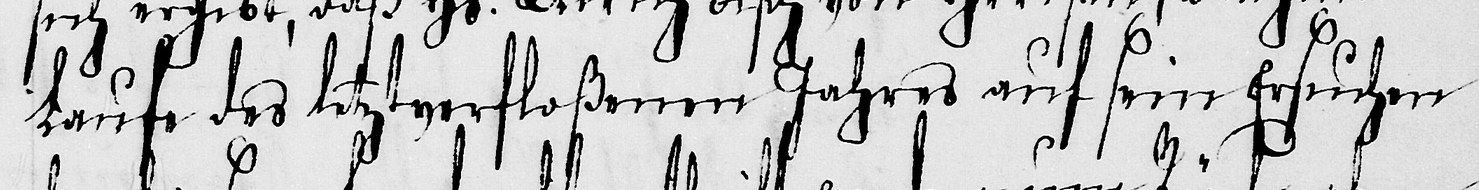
Laufe des letztverfloßenen Jahres auf sein Ersuchen
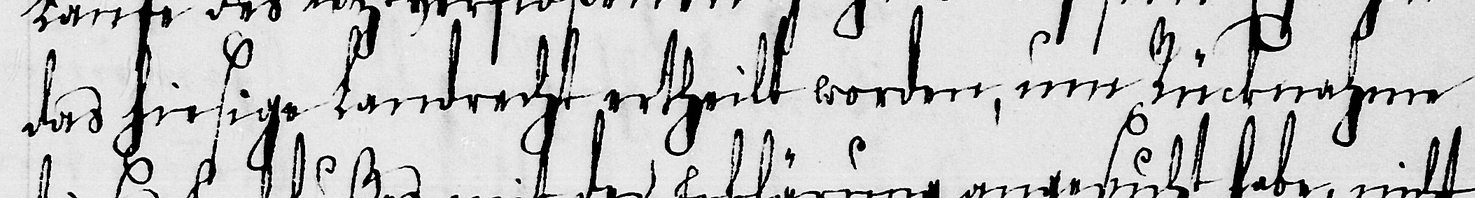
das hiesige Landrecht ertheilt worden, um Rücknahme
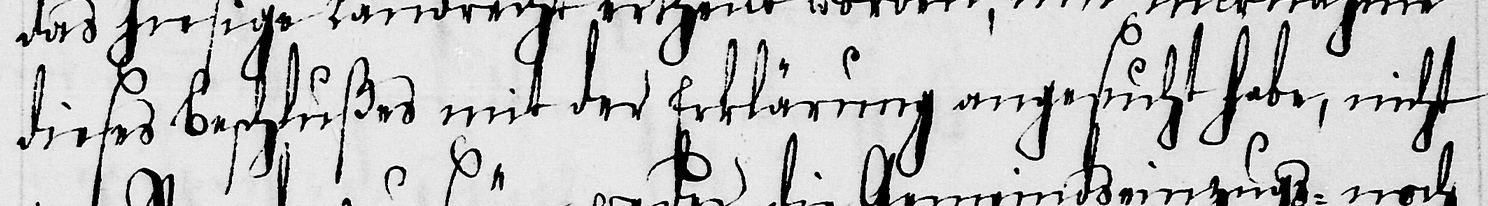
dieses Beschlußes mit der Erklärung angesucht habe, nicht
